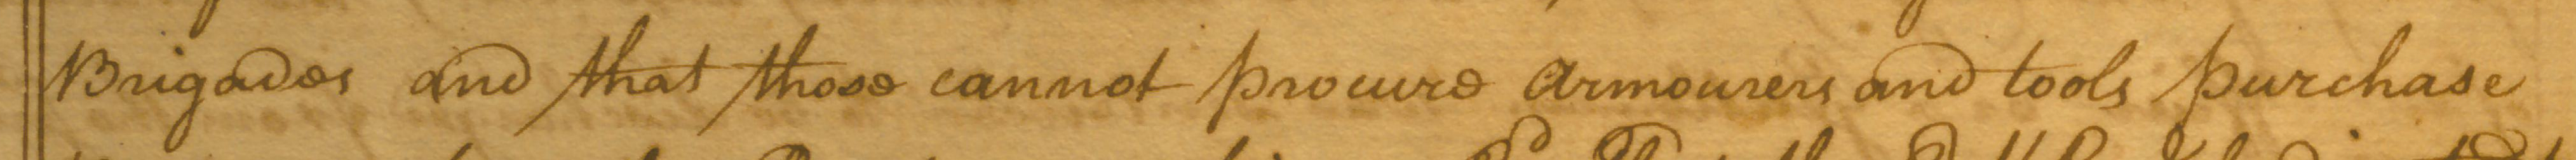Brigades and that those cannot procure armourers and tools purchase
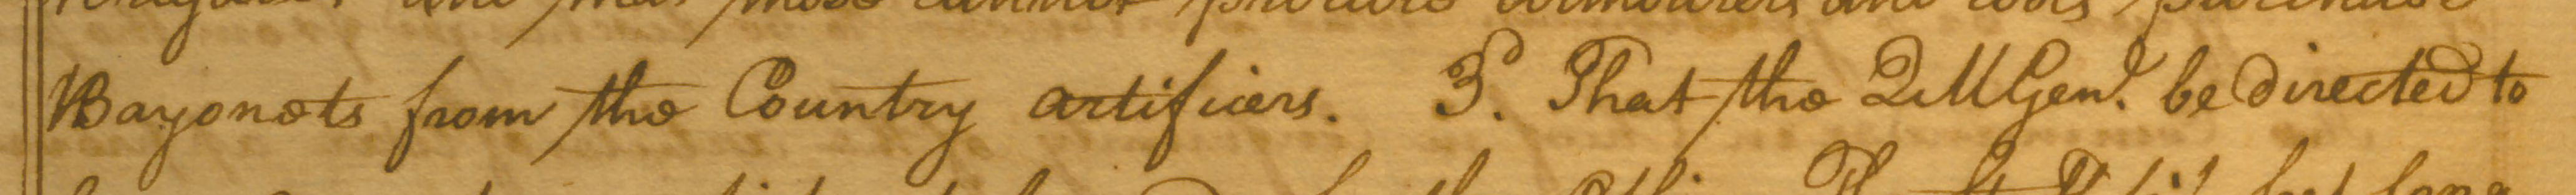Bayonets from the Country artificiers. 3^d. That the QMGen^l. be directed to
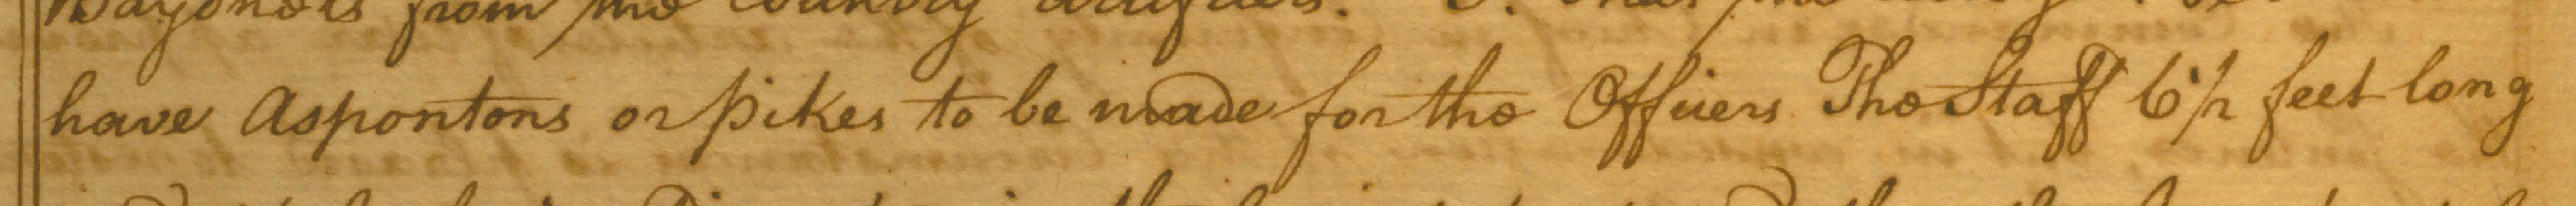have aspontons or pikes to be made for the Officers The Staff 6 1/2 feet long
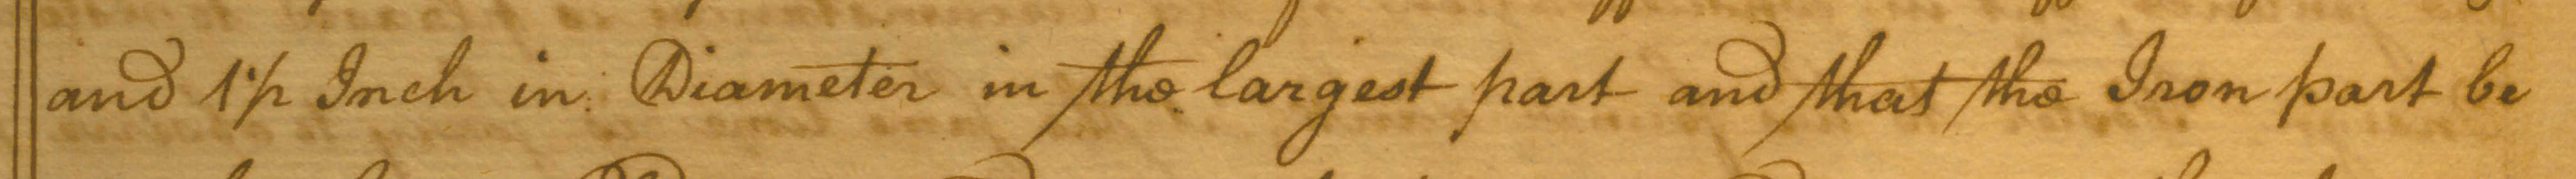and 1 1/2 Inch in Diameter in the largest part and that the Iron part be
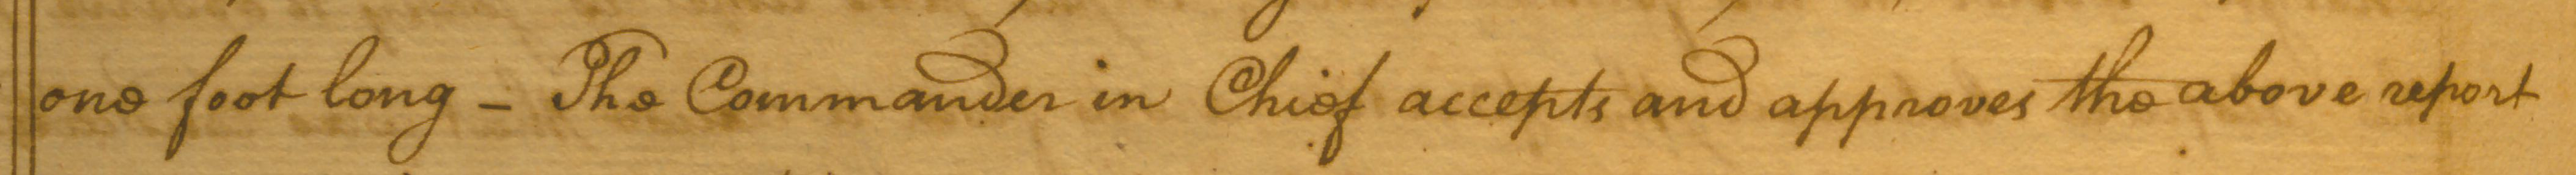one foot long- The Commander in Chief accepts and approves the above report
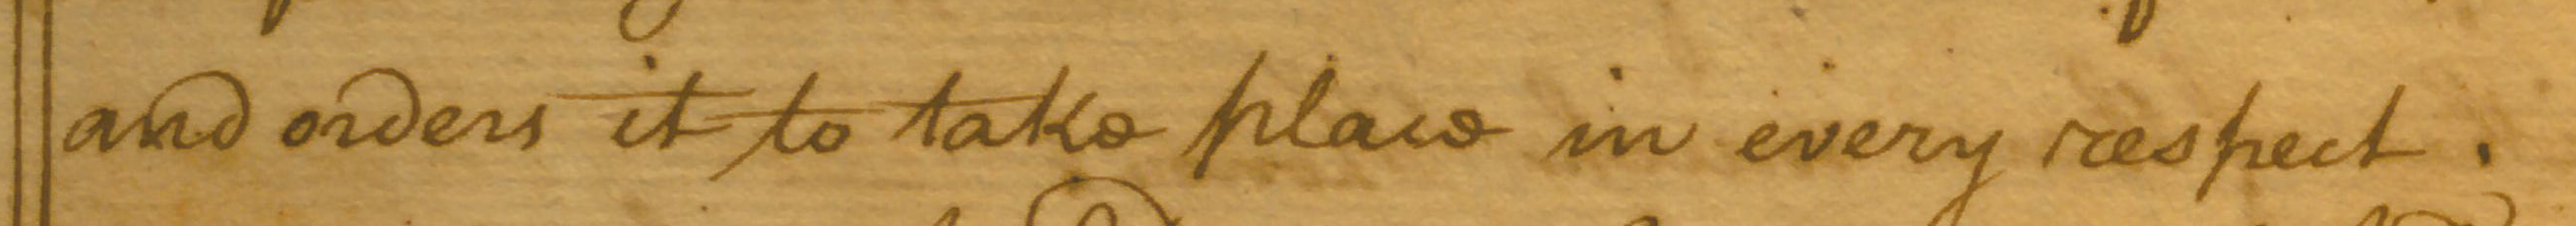and orders it to take place in every respect.
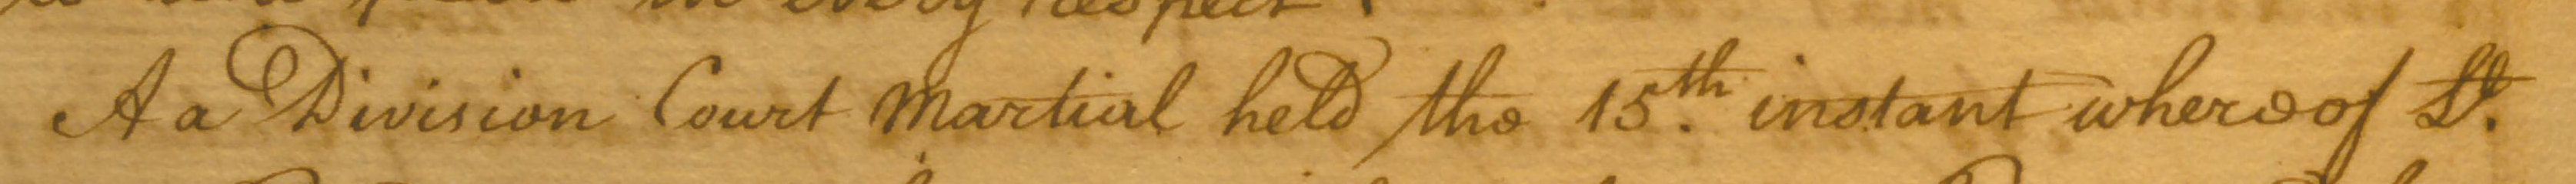A a Division Court Martial held the 15^th. instant whereof L^t.
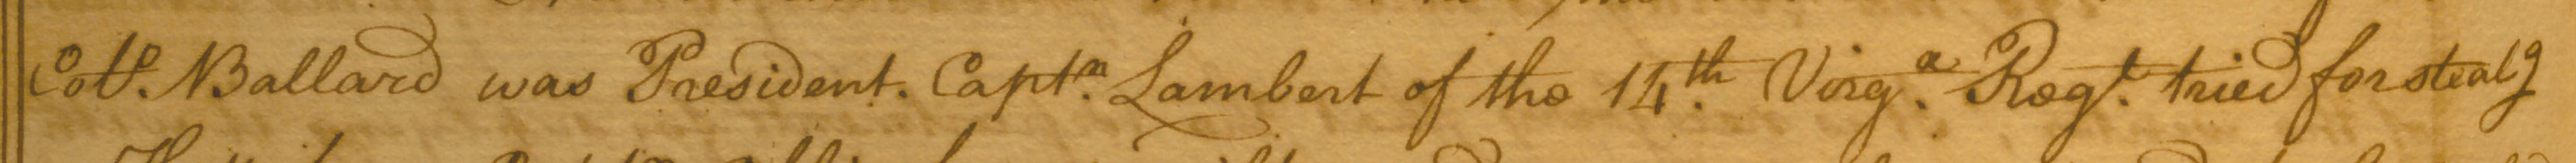Col^o. Ballard was President. Capt^n. Lambert of the 14^th. Virg^a. Reg^t. tried for steal^g
